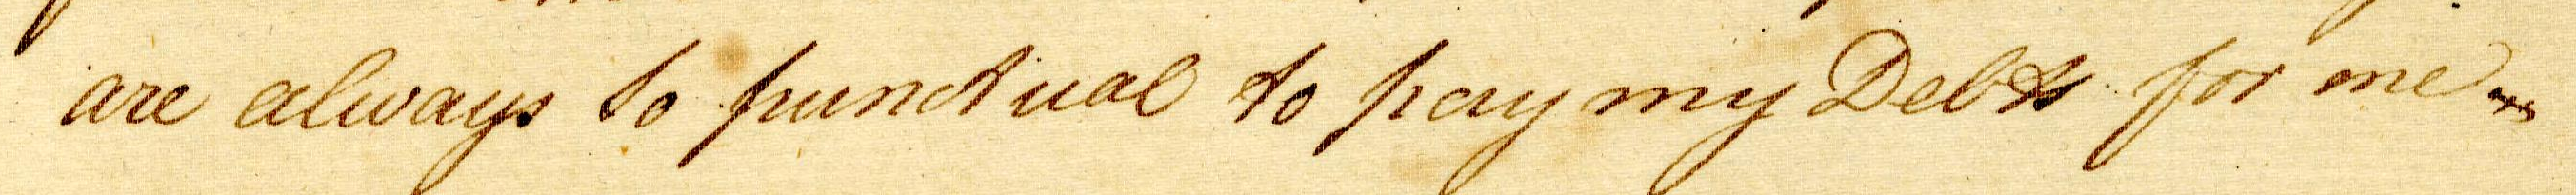are always So punctual to pay my Debts for me.
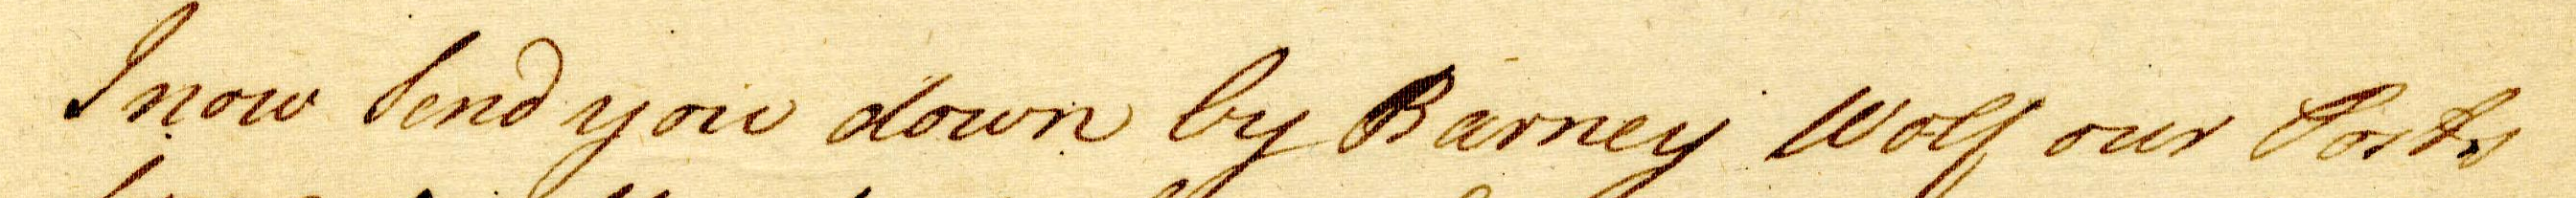I now Send you down by Barney Wolf our Posts
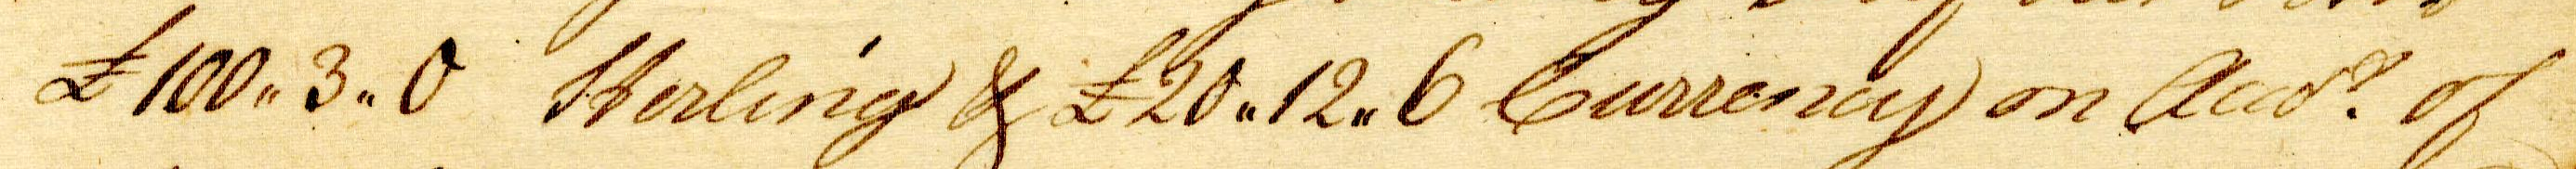£100..3..0 Sterling & £20..12..6 Currency on Acco^t. of
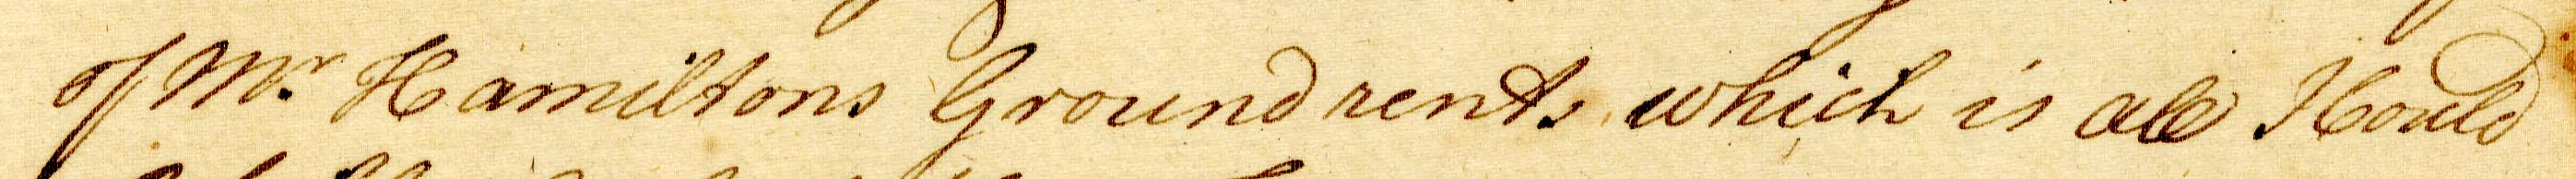of M^r. Hamiltons Ground renys which is all I Could
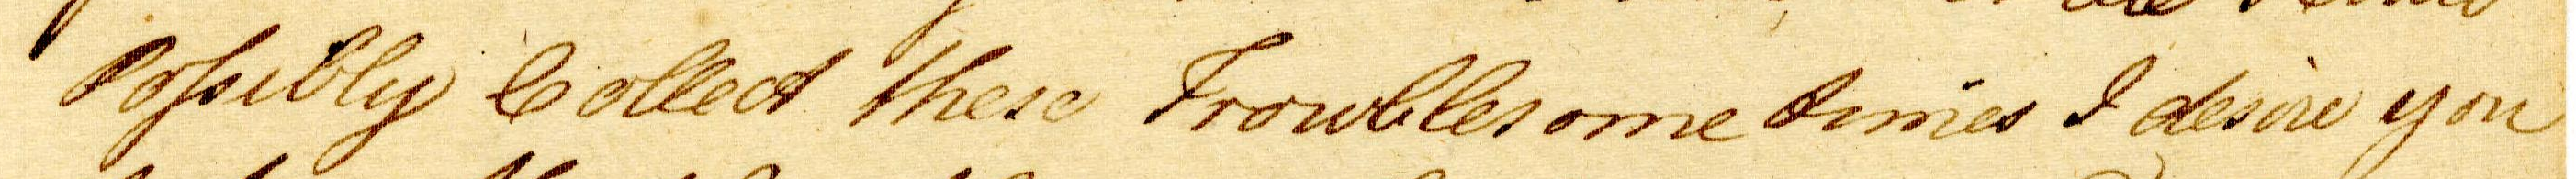Possibly Collect these Troublesome times I desire you
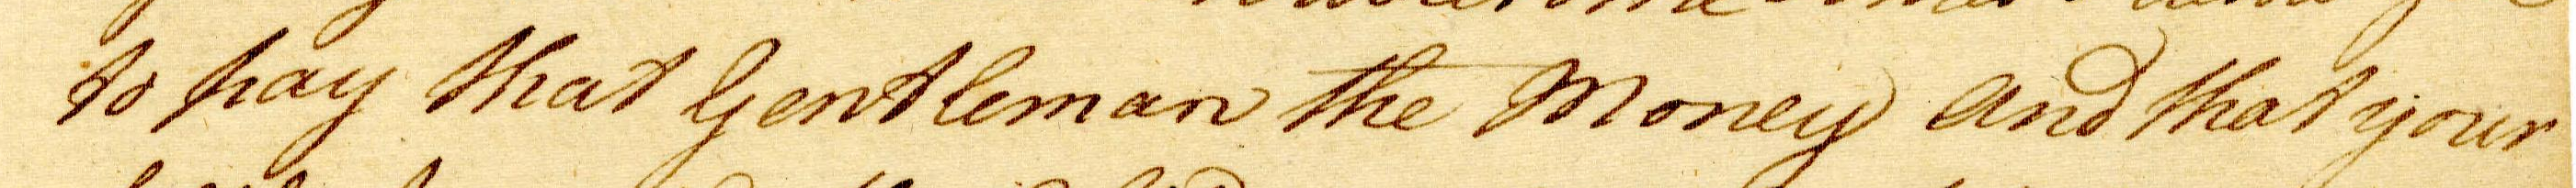so pay that Gentleman the Money And that your
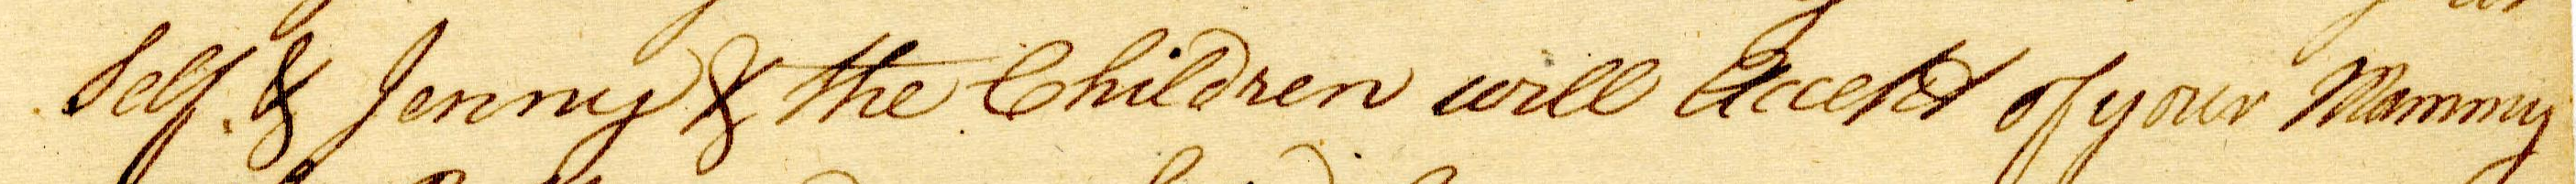Self, & Jenny & the Children will Accept of your Mammy
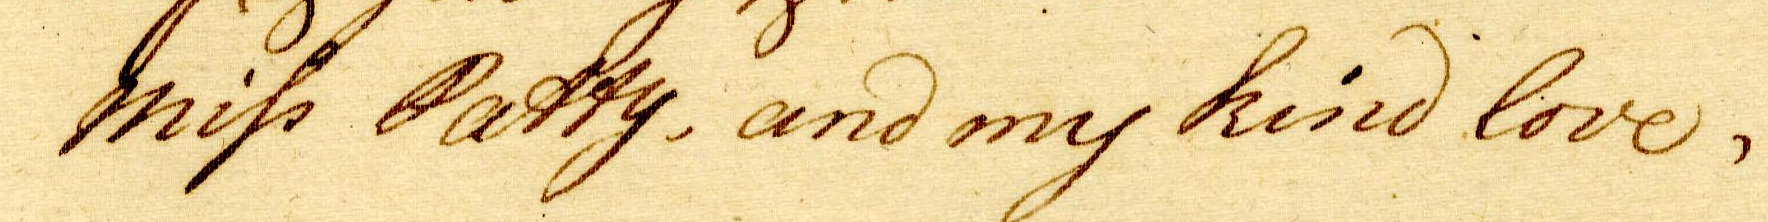Miss Patty, and my kind love,
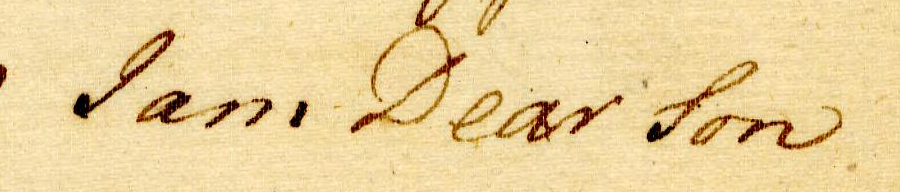I am Dear Son
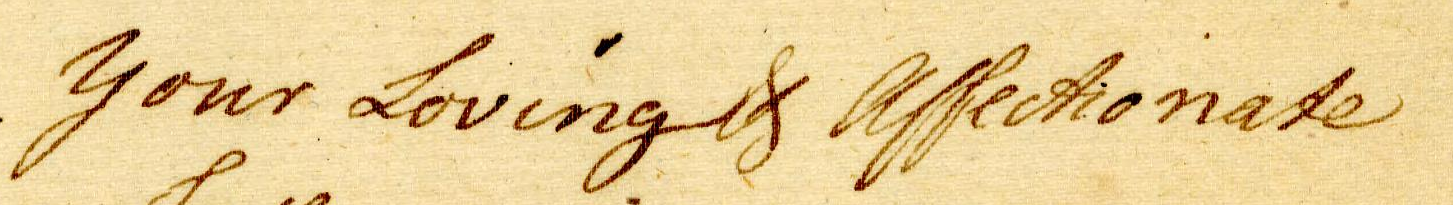Your Loving & Affectionate
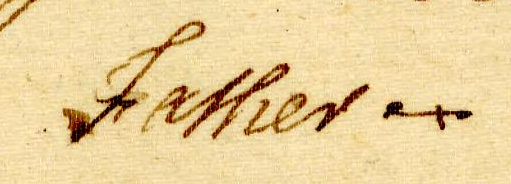Father-
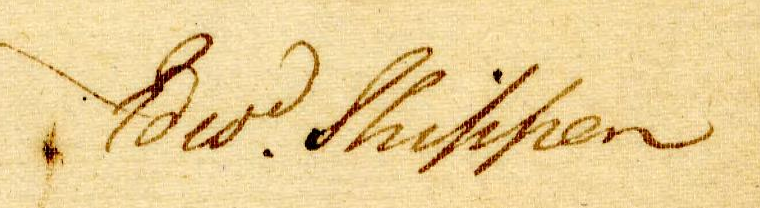Edw^d. Shippen
